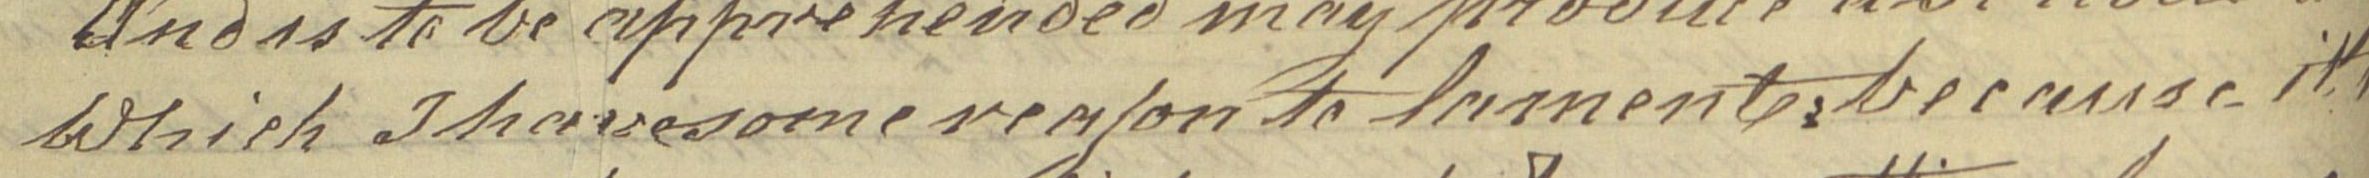Which I have some reason to lament because it
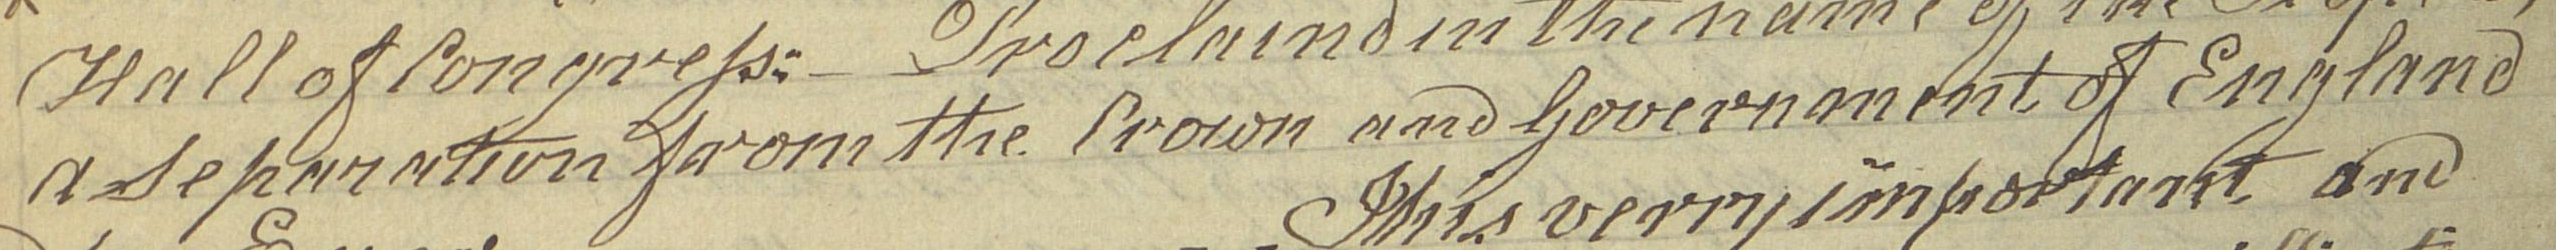a separation from the Crown and Government of England
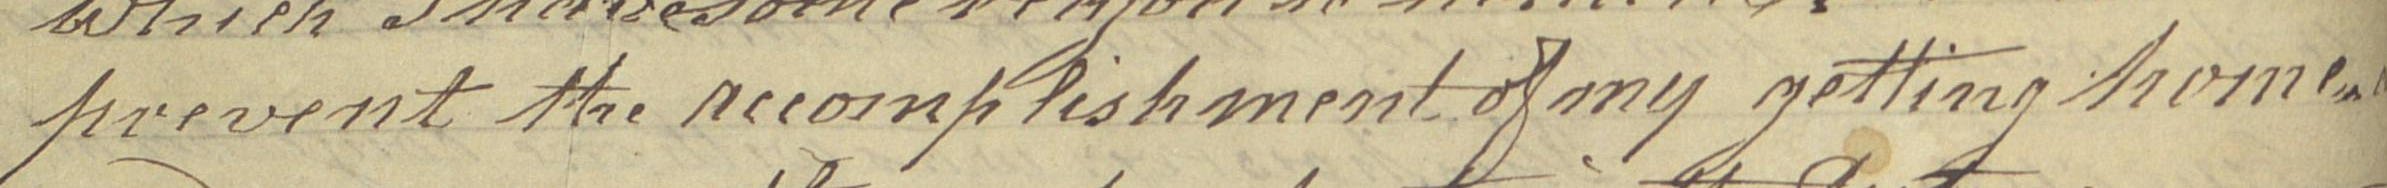prevent the accomplishment of my getting home
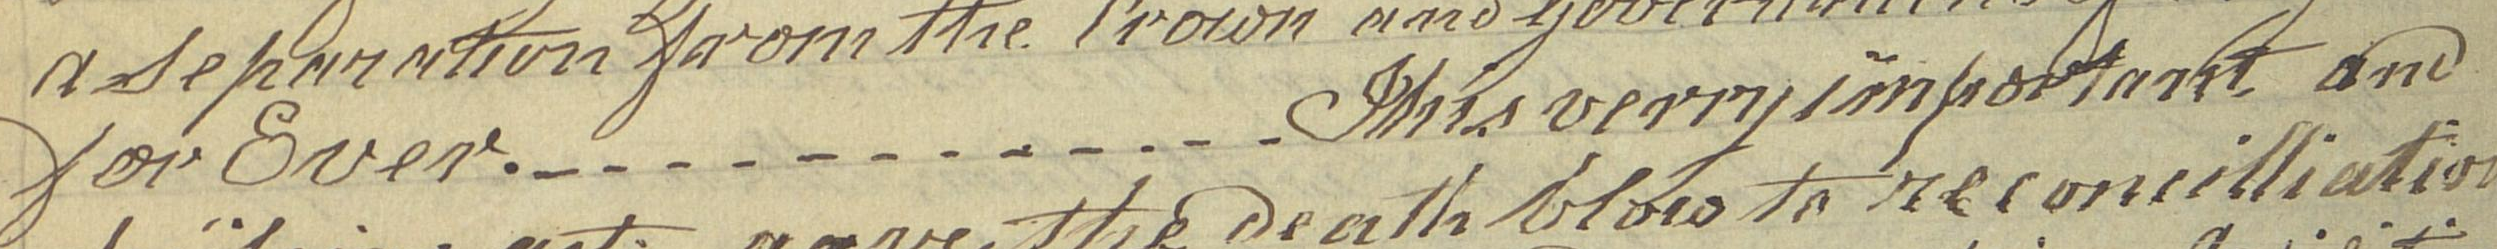for Ever. This verry important and
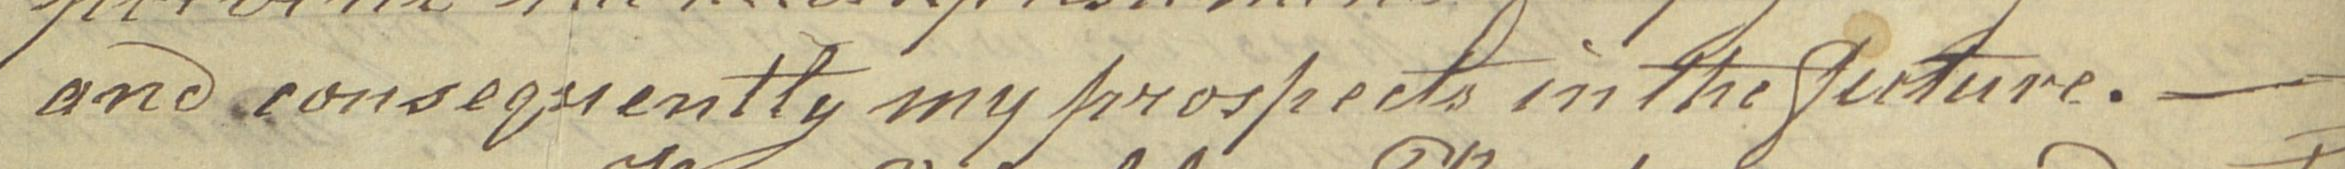and consequently my prospects in the future.
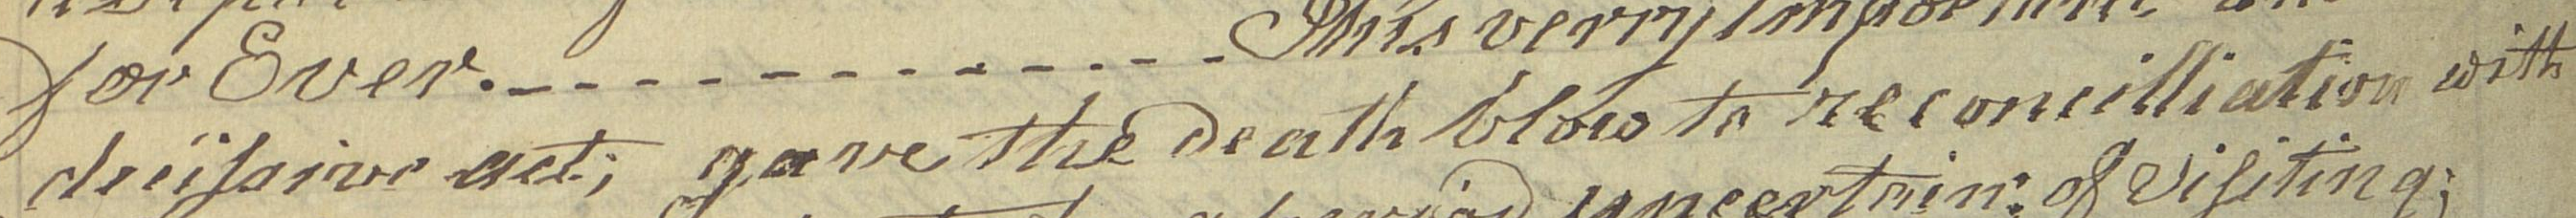decissive act; gave the death blow to reconcilliation with
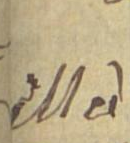Med
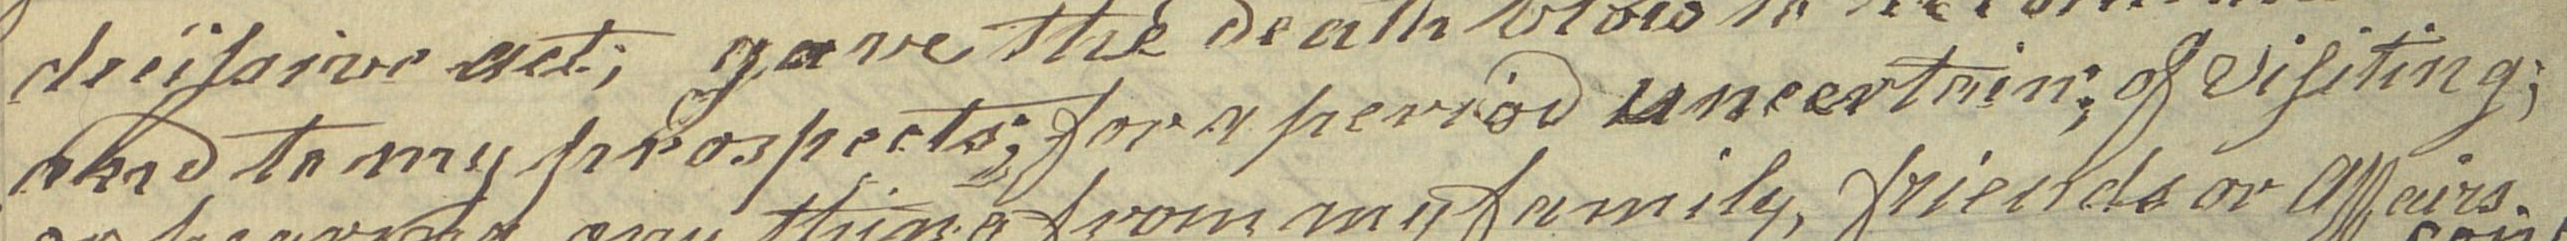and to my prospects; for a period uncertain; of Visiting;
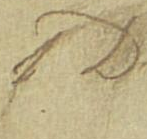1 D
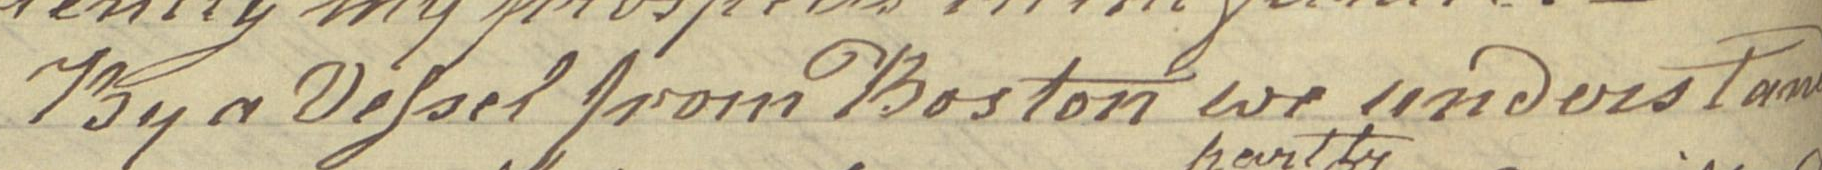By a Vessel from Boston we understand
